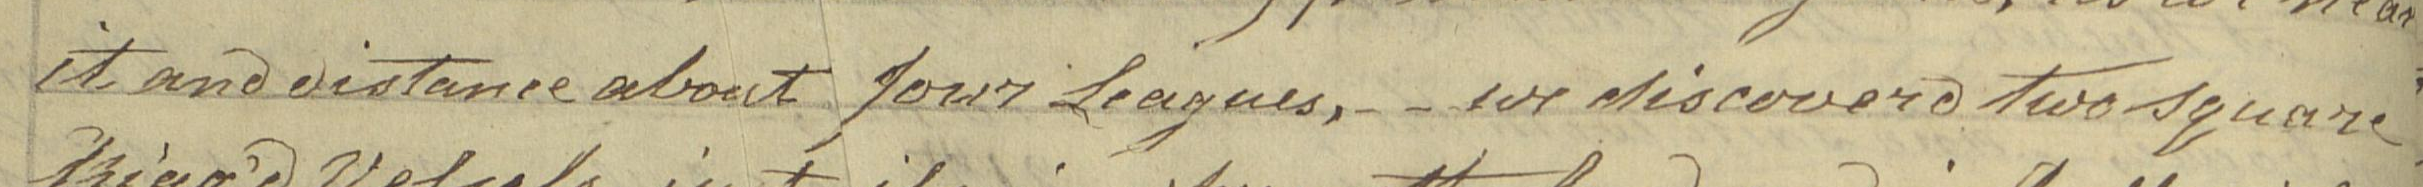it and distance about four Leagues, we discoverd two square
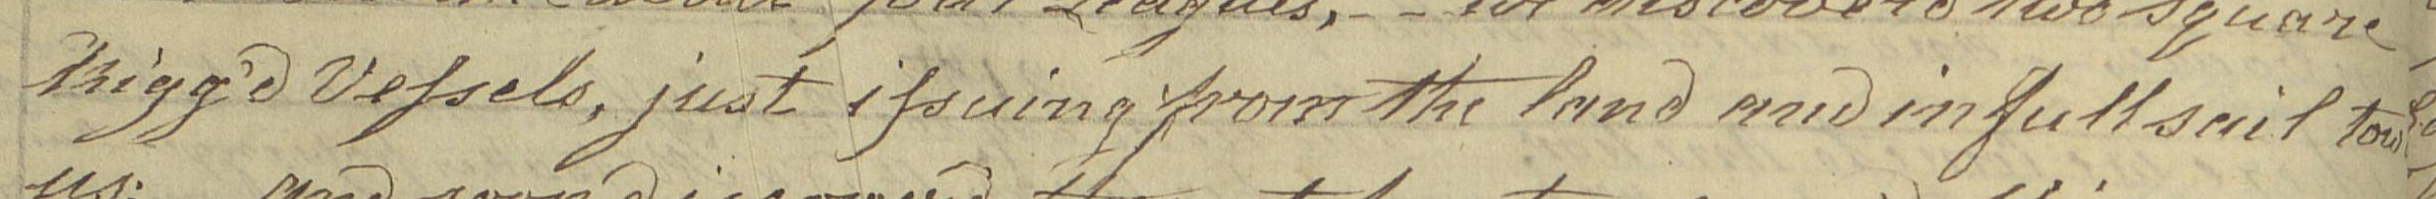Rigg'd Vessels, just issuing from the land and in full sail to-
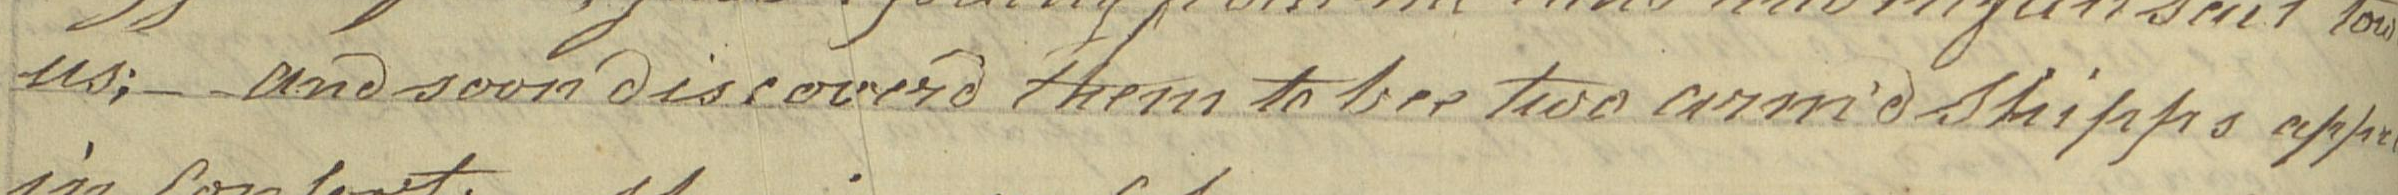us; and soon discoverd them to bee two arm'd shipps app-
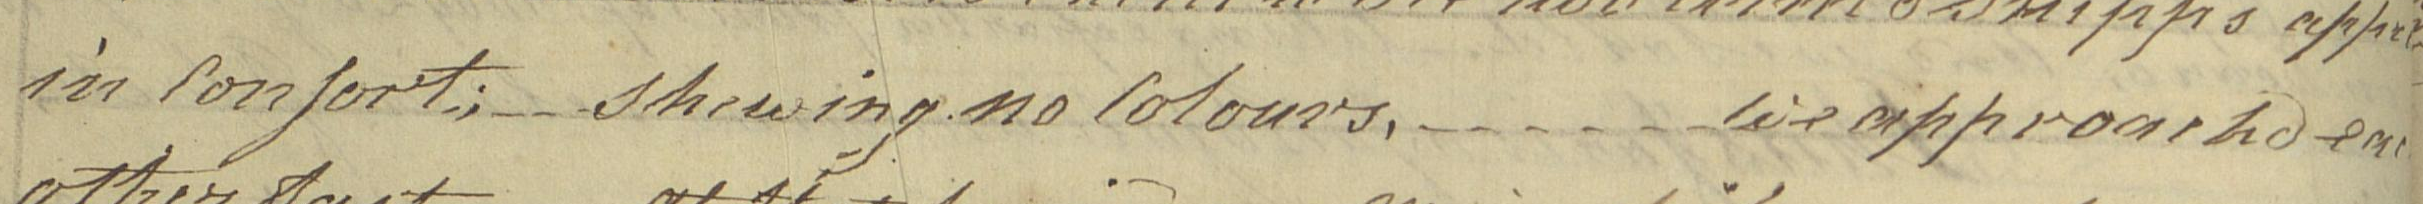in comfort:- shewing no Colours. we approached en-
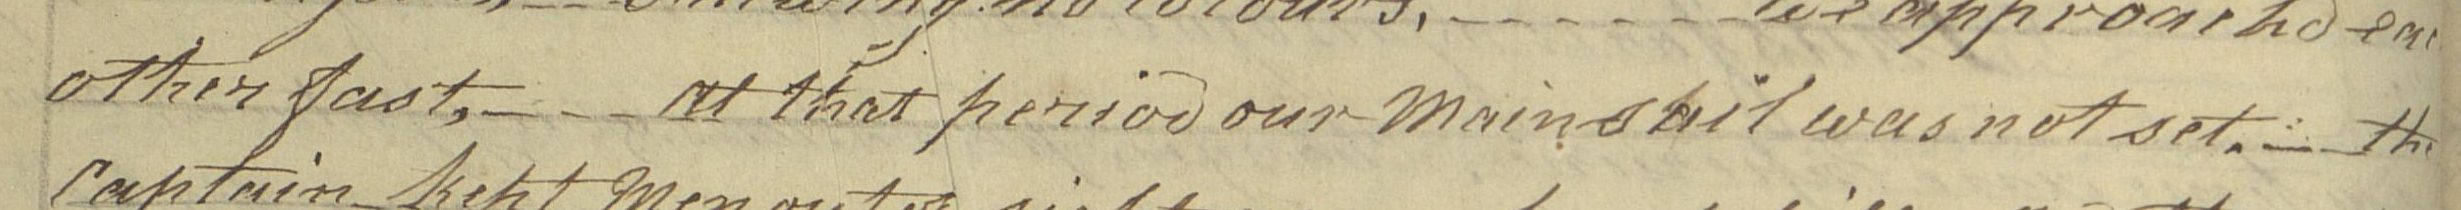other fast. At that period our Main sail was not set. the
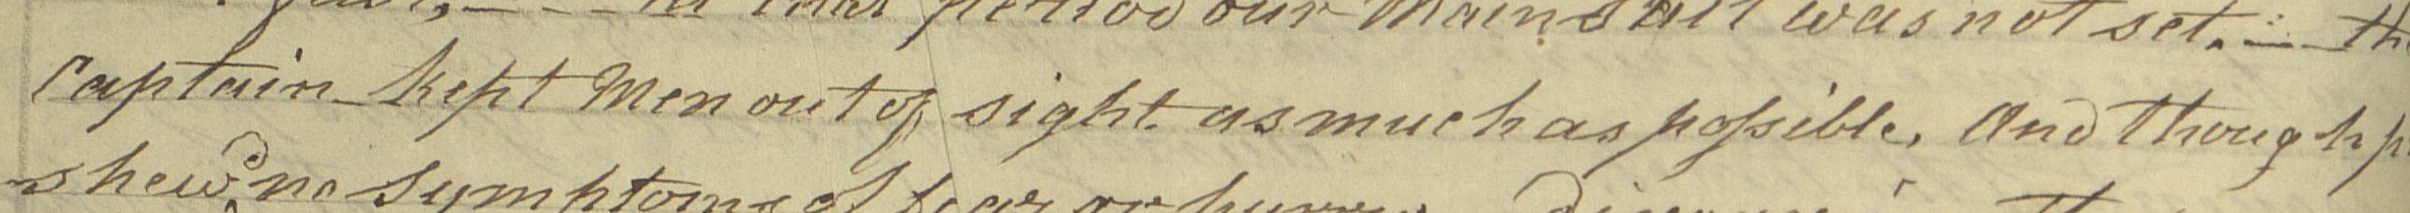captain kept men out of sight as much as possible, and though p-
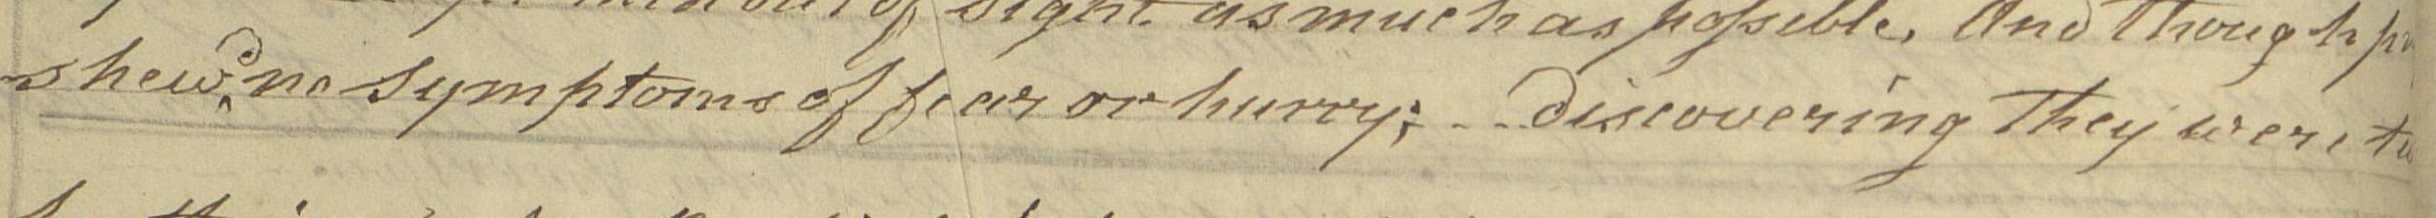shew^d no symptoms of fear or hurry; discovering they were to
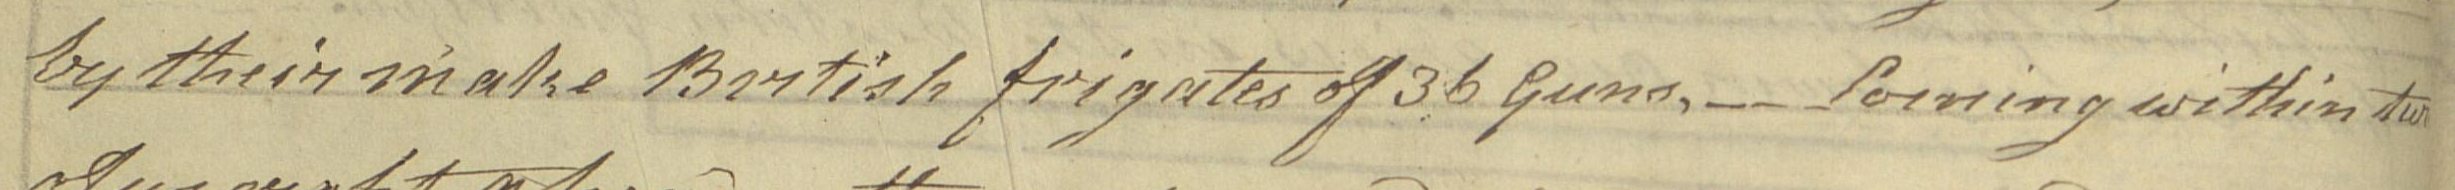by their make British frigates of 36 Guns, Coming within two
